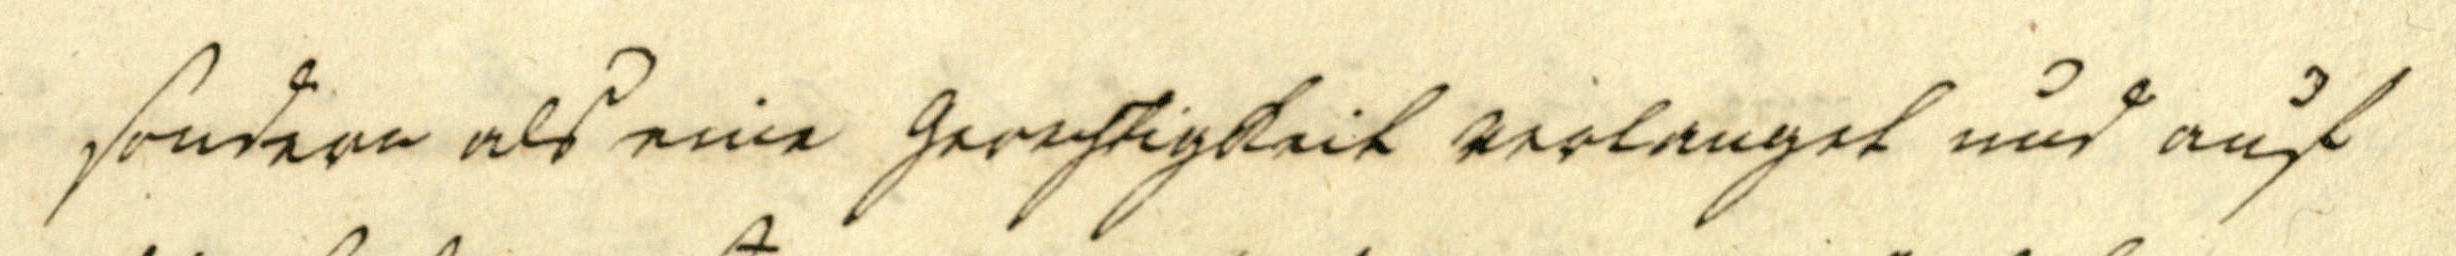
sondern als eine Gerechtigkeit verlanget und auf
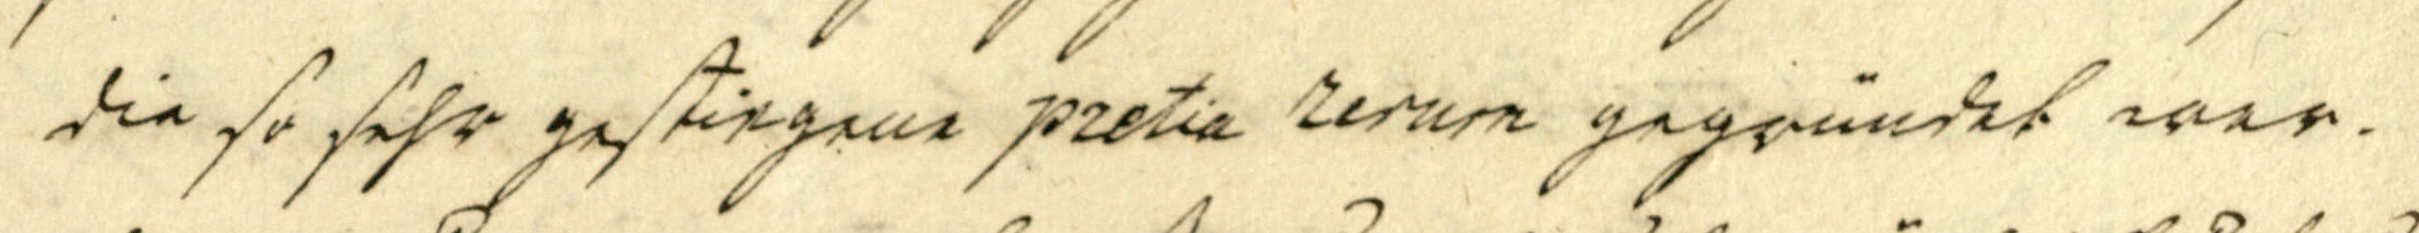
die so sehr gestiegene pretia rerum gegründet wer¬
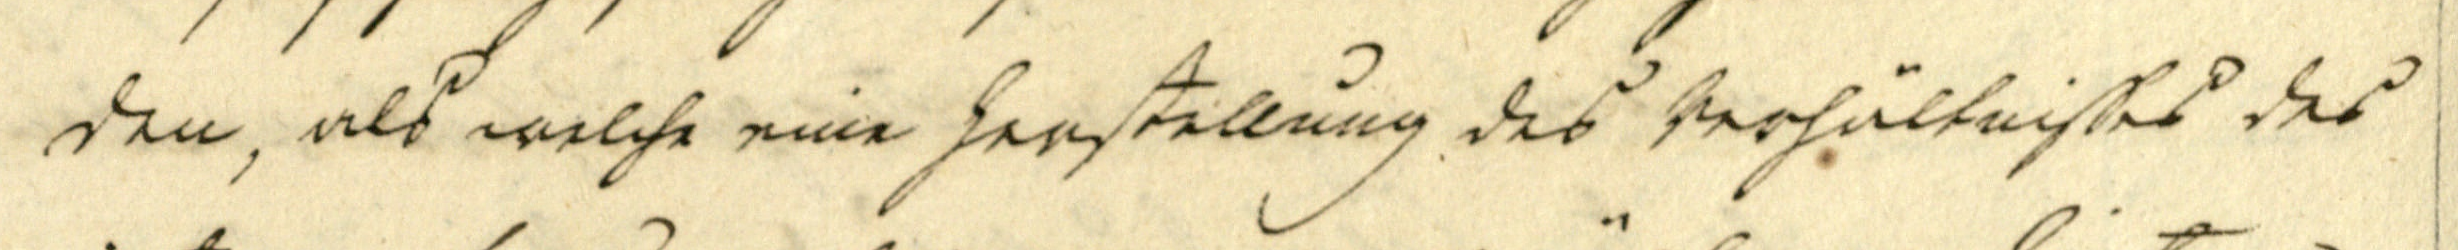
den, als welche eine Herstellung des Verhältnisses des
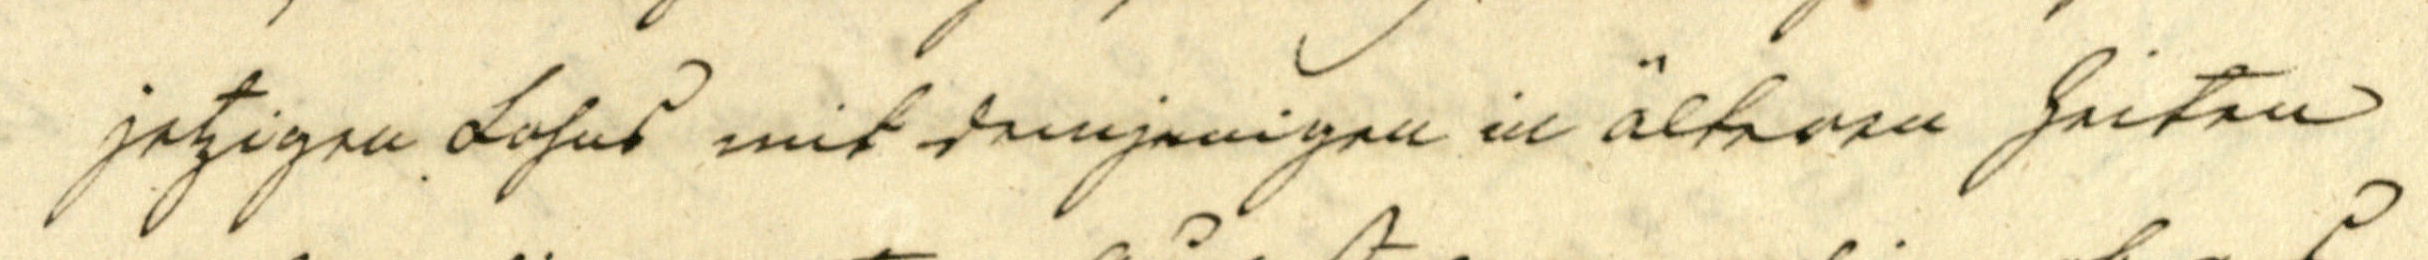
jetzigen Lohns mit demjenigen in älteren Zeiten
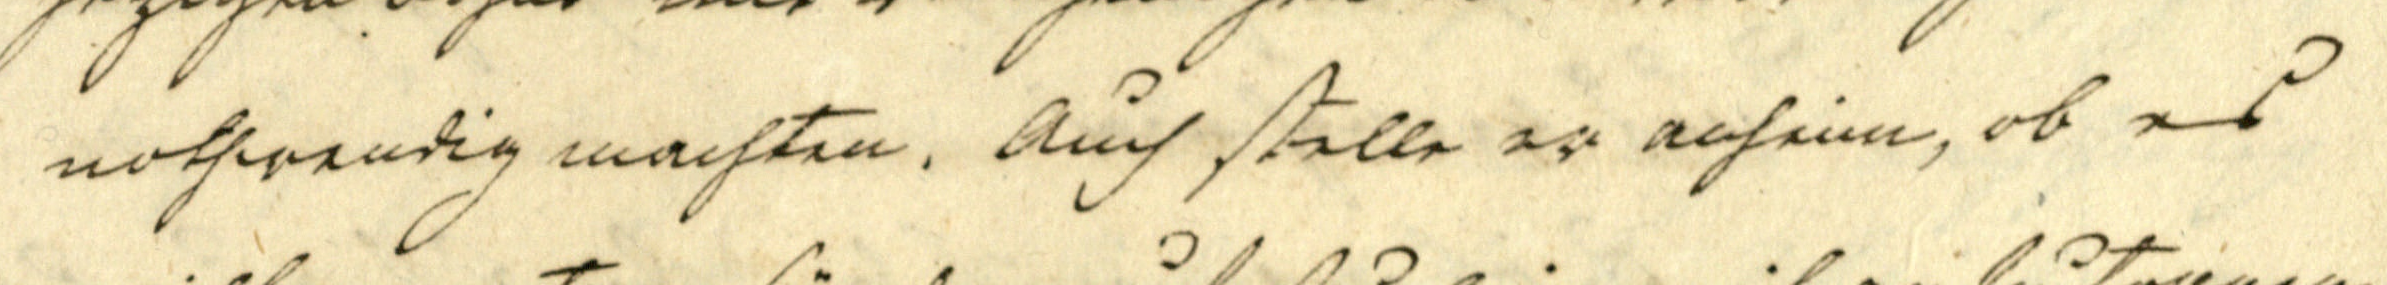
nothwendig machten. Auch stelle er anheim, ob es
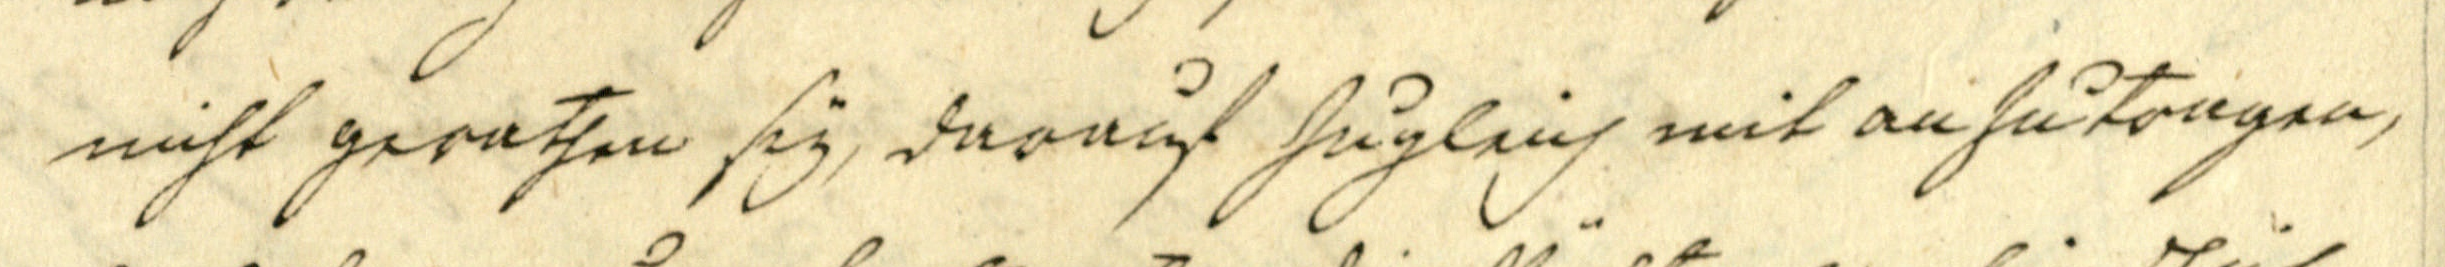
nicht gerathen seÿ, darauf zugleich mit anzutragen,
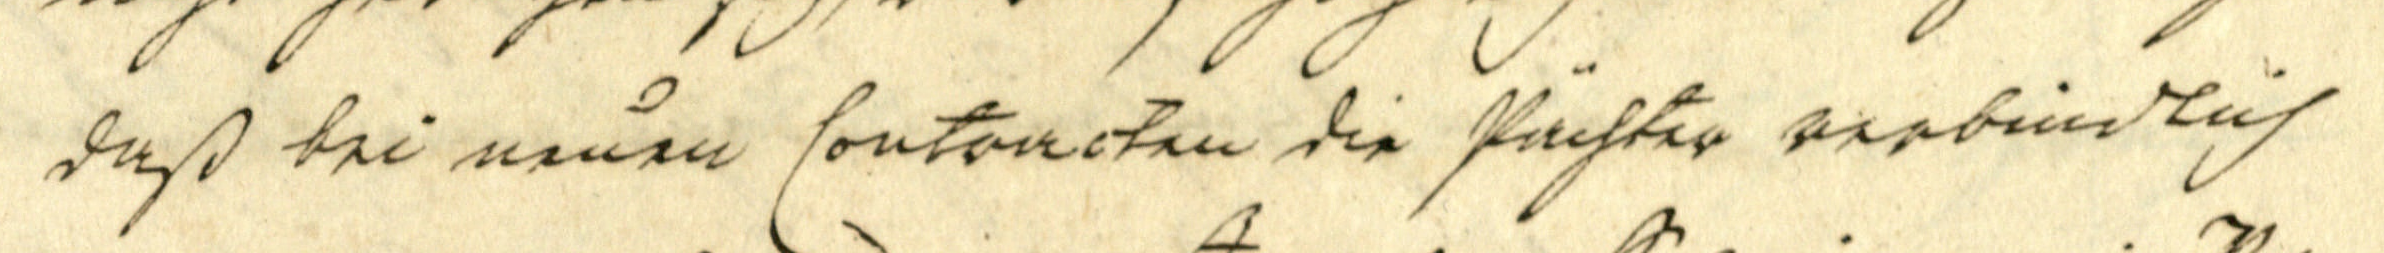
daß bei neuen Contracten die Pächter verbindlich
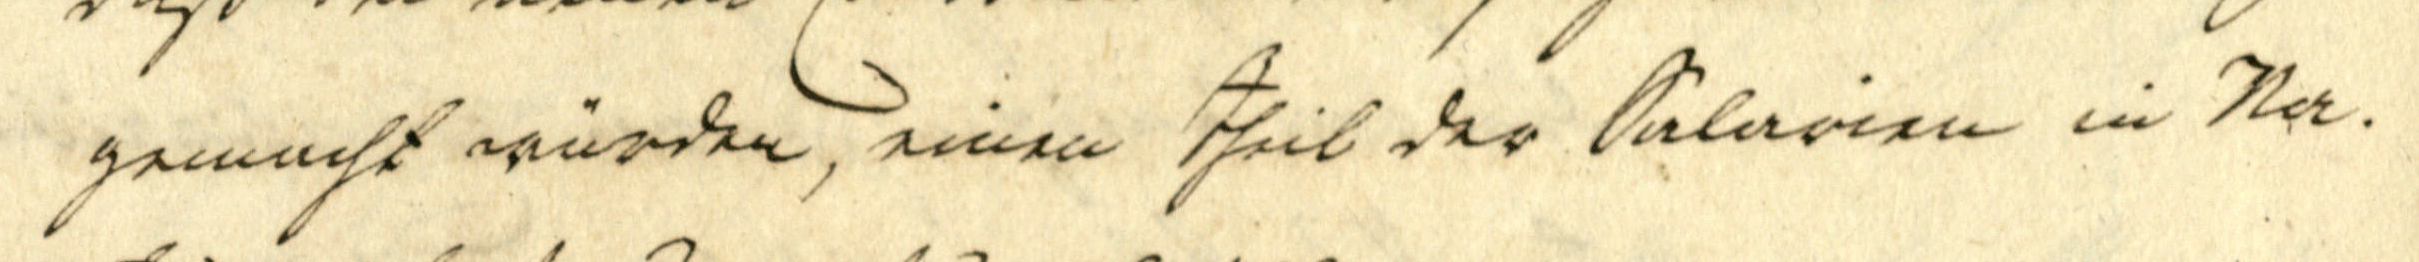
gemacht würden, einen Theil der Salarien in Na¬
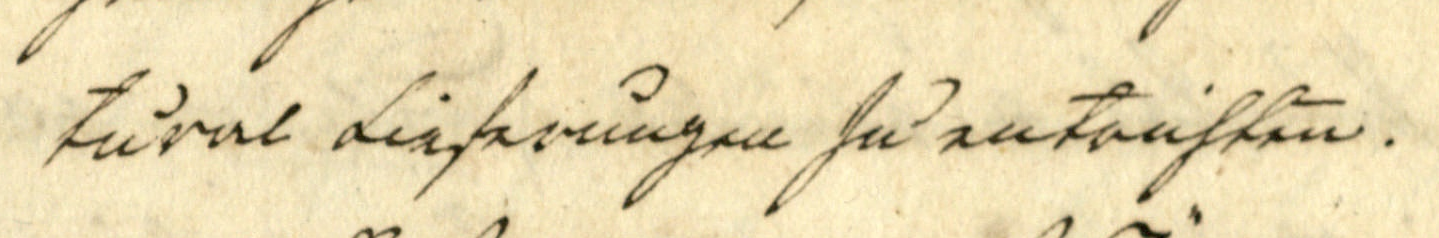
tural Lieferungen zu entrichten.
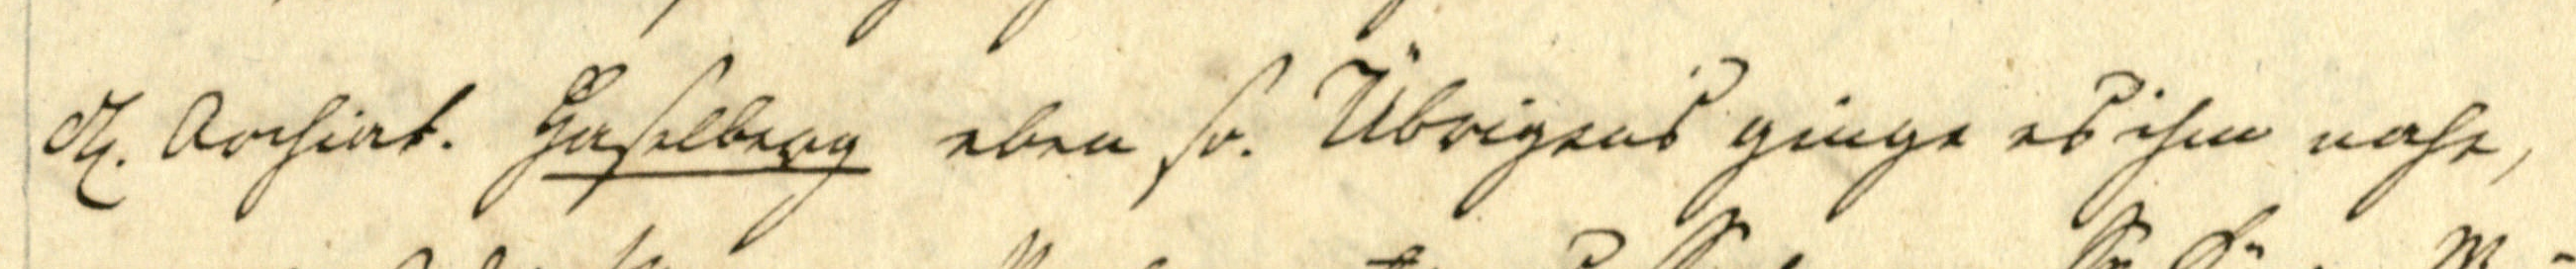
dh. Archiat. Haselberg eben so. Übrigens ginge es ihm nahe,
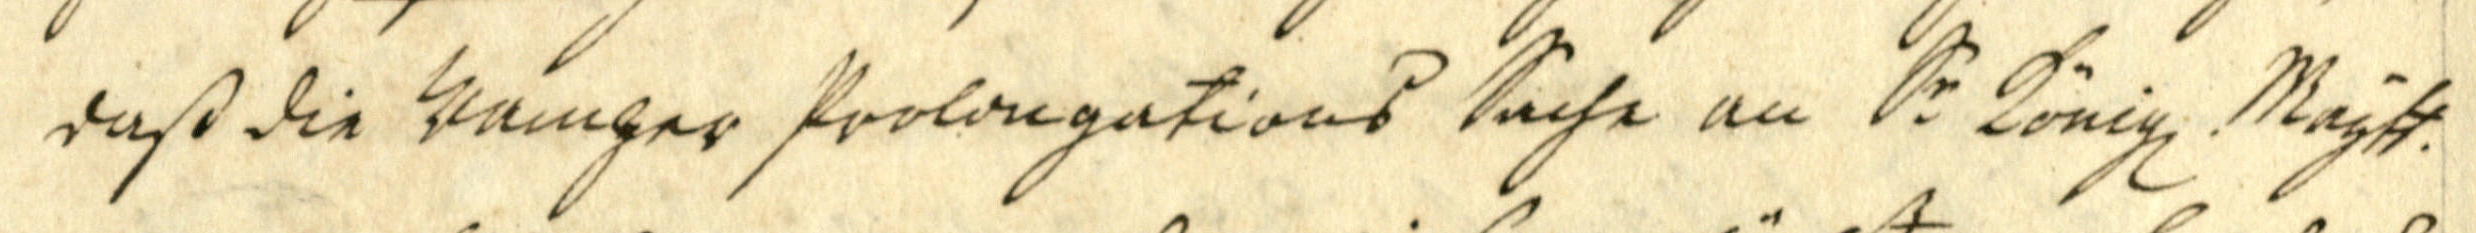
daß die Wamper Prolongations Sache an Sr Königl. Maÿtt.
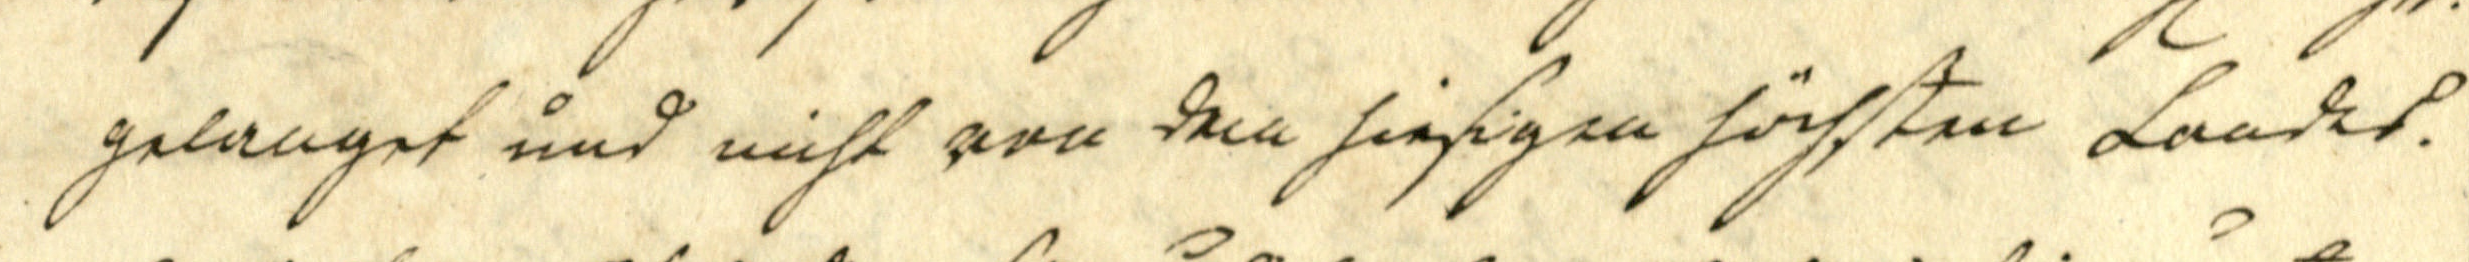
gelanget und nicht von dem hiesigen höchsten Landes¬
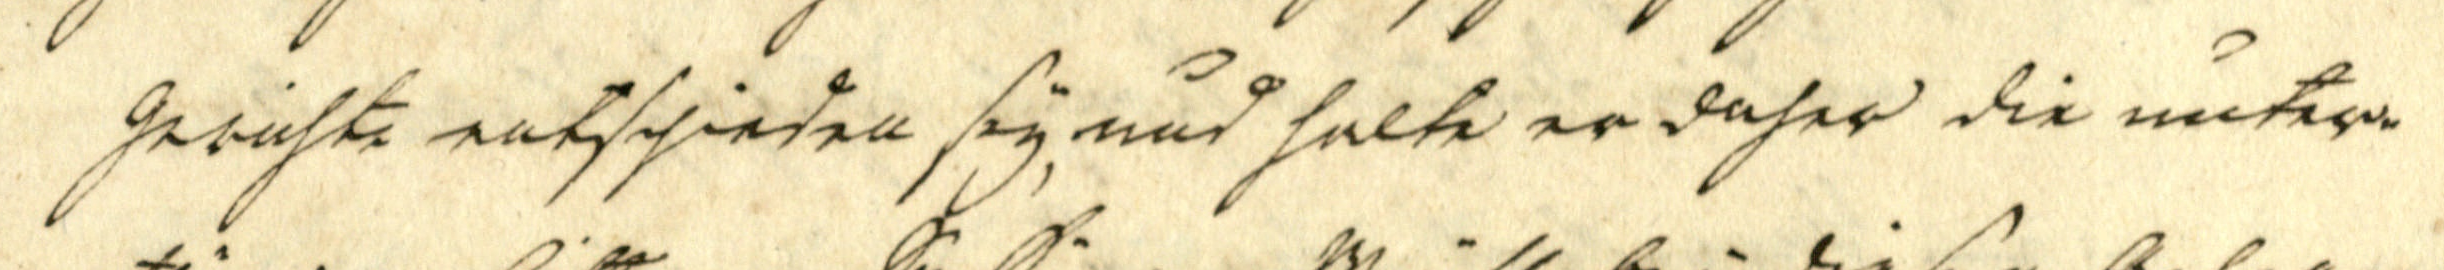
Gericht entschieden seÿ, und halte er daher die unter¬
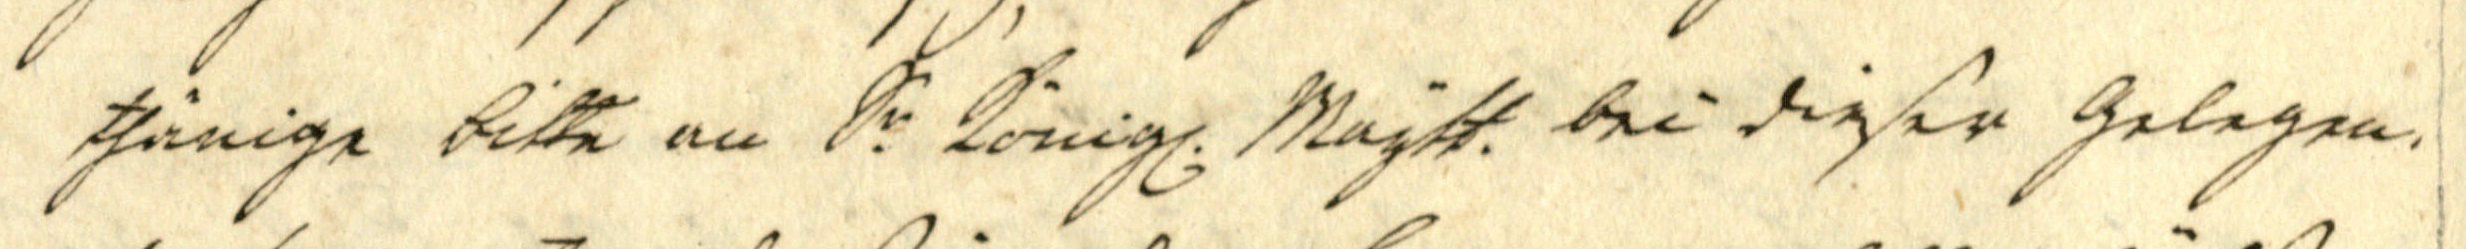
thänige Bitte an Sr Königl. Maÿtt. bei dieser Gelegen¬
